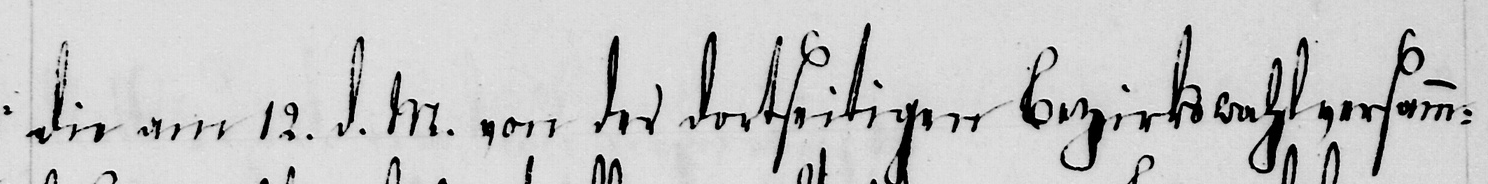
die am 12. d. M. von der dortseitigen Bezirkswahlversam¬
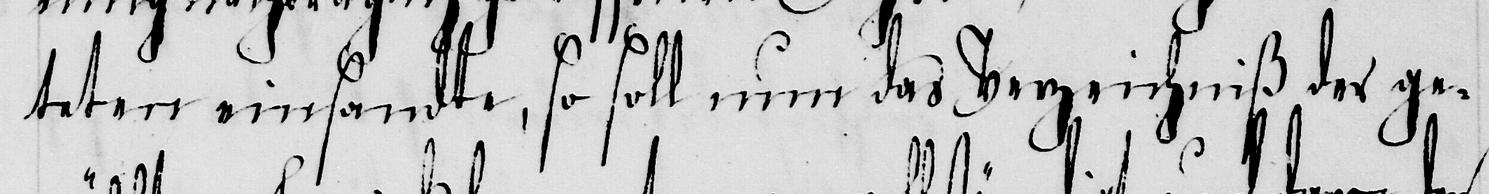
teten einsandte, so soll nun das Verzeichniß der ge¬
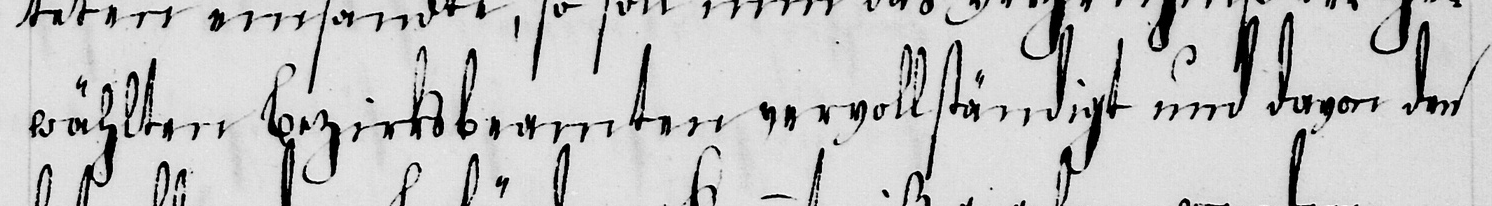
wählten Bezirksbeamten vervollständigt und davon den
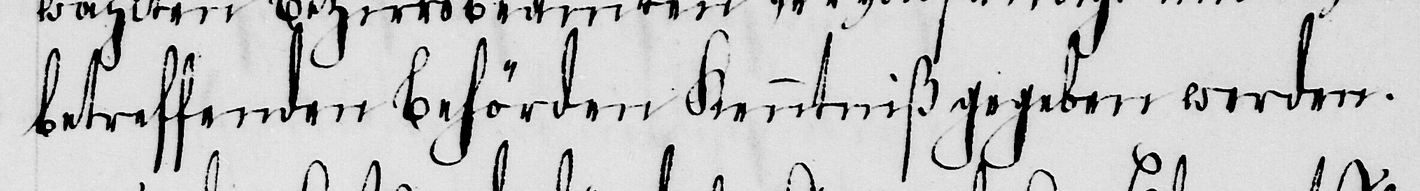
betreffenden Behörden Kenntniß gegeben werden.
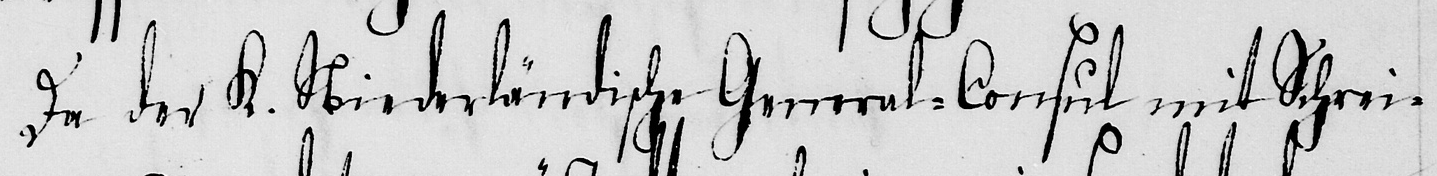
Da der K. Niederländische General-Consul mit Schrei¬
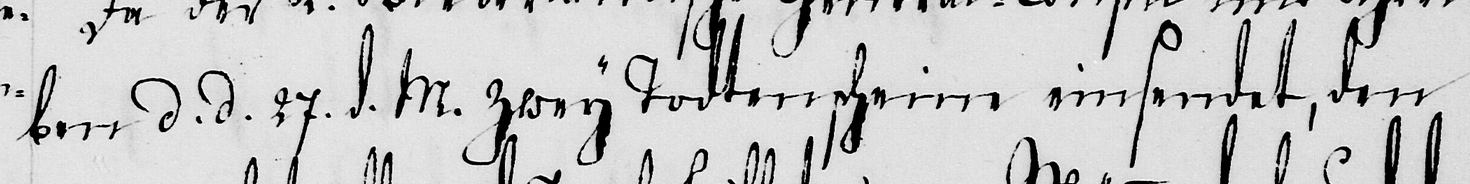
ben d. d. 27. d. M. zwey Todtenscheine einsendet, den
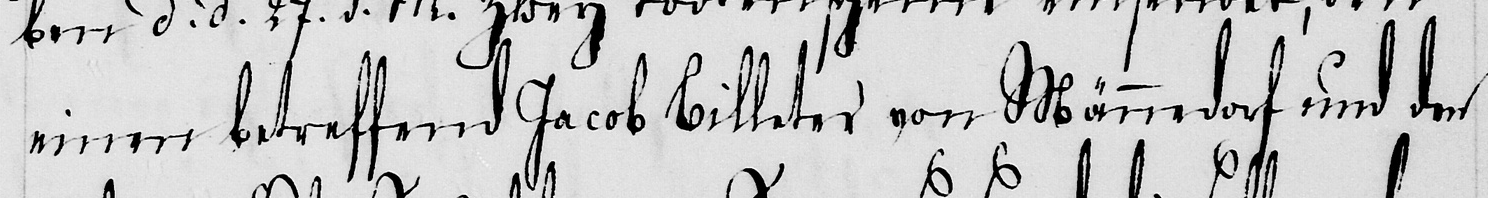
einen betreffend Jacob Billeter von Männedorf und den
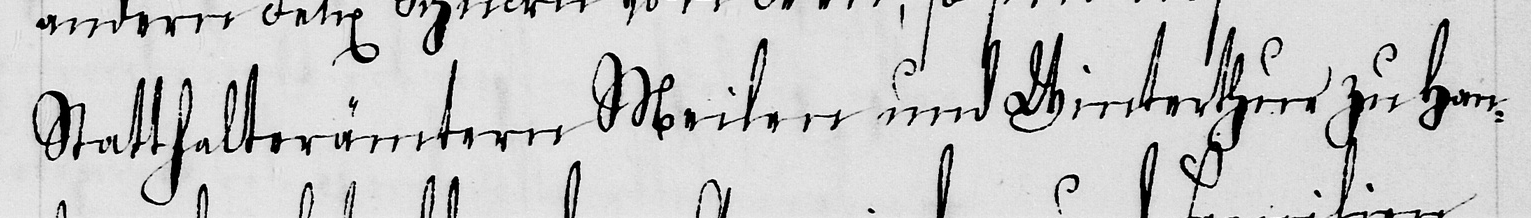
Statthalterämtern Meilen und Winterthur zu Han¬
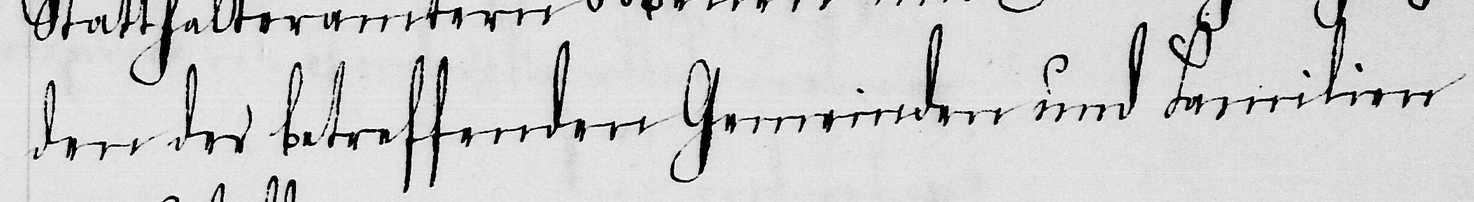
den der betreffend Gemeinden und Familien
